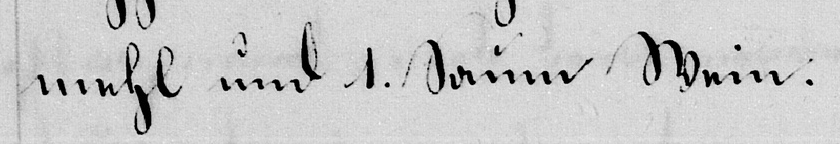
mehl und 1. Saum Wein.
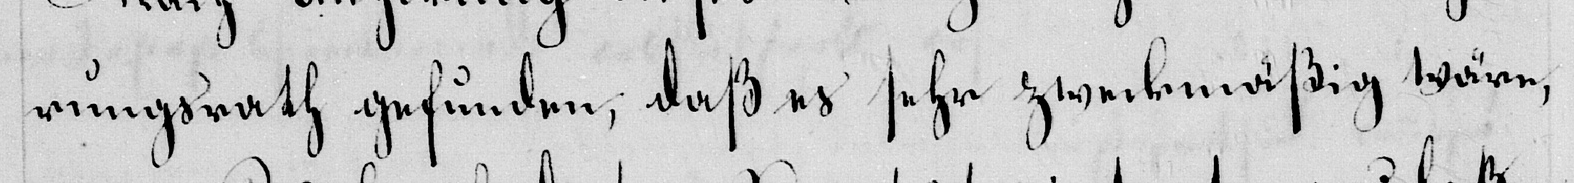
rungsrath gefunden, daß es sehr zweckmäßig wäre,
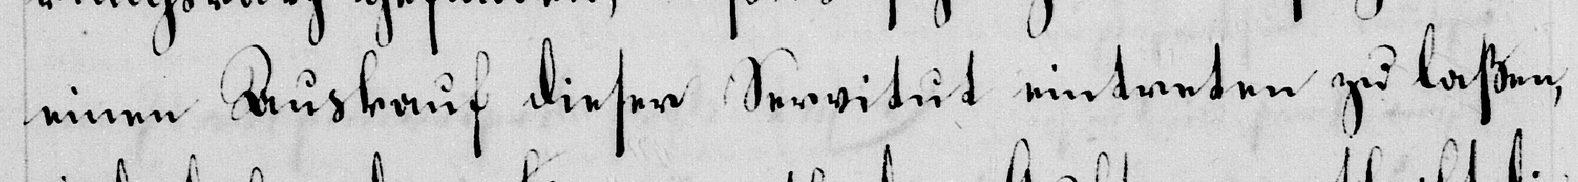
einen Auskauf dieser Servitut eintreten zu laßen,
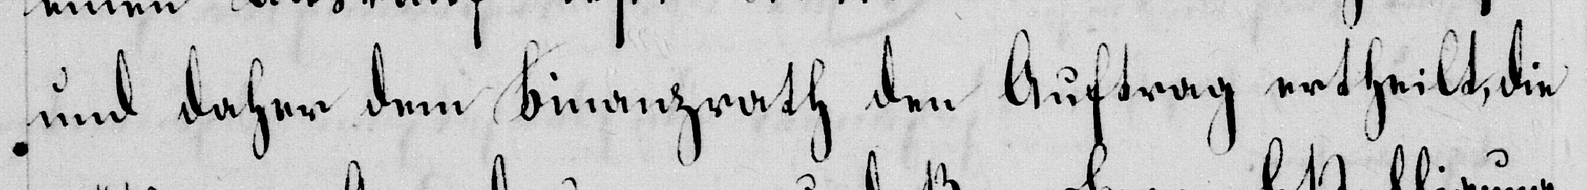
und daher dem Finanzrath den Auftrag ertheilt, die
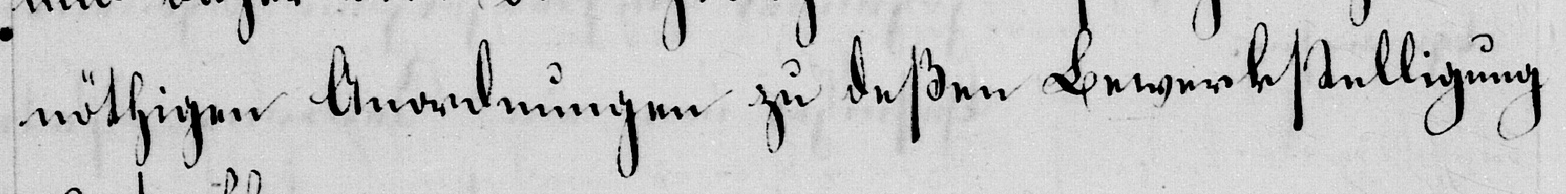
nöthigen Anordnungen zu deßen Bewerkstelligung
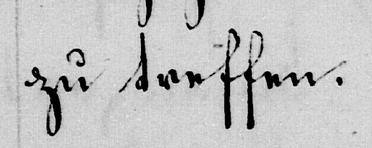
zu treffen.
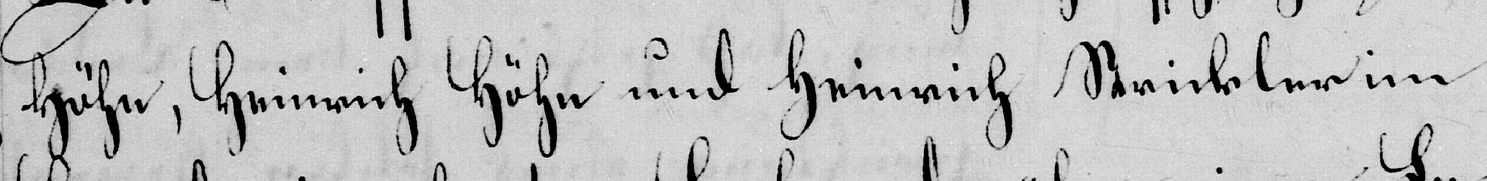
Höhn, Heinrich Höhn und Heinrich Strickler im
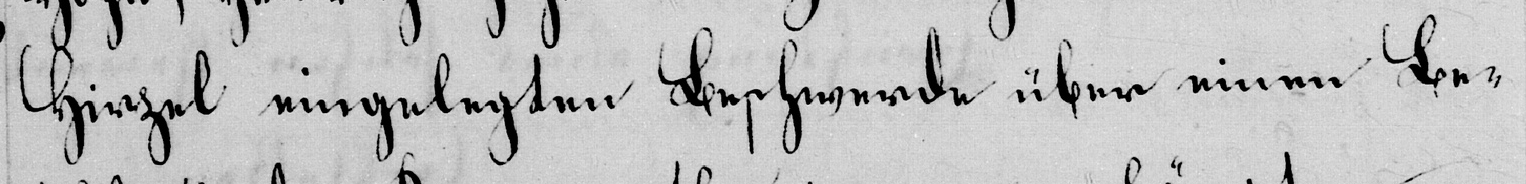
Hirzel eingelegten Beschwerde über einen Be¬
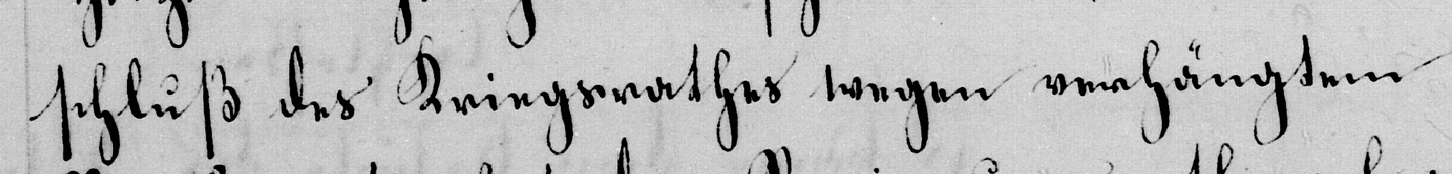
schluß des Kriegsrathes wegen verhängten
